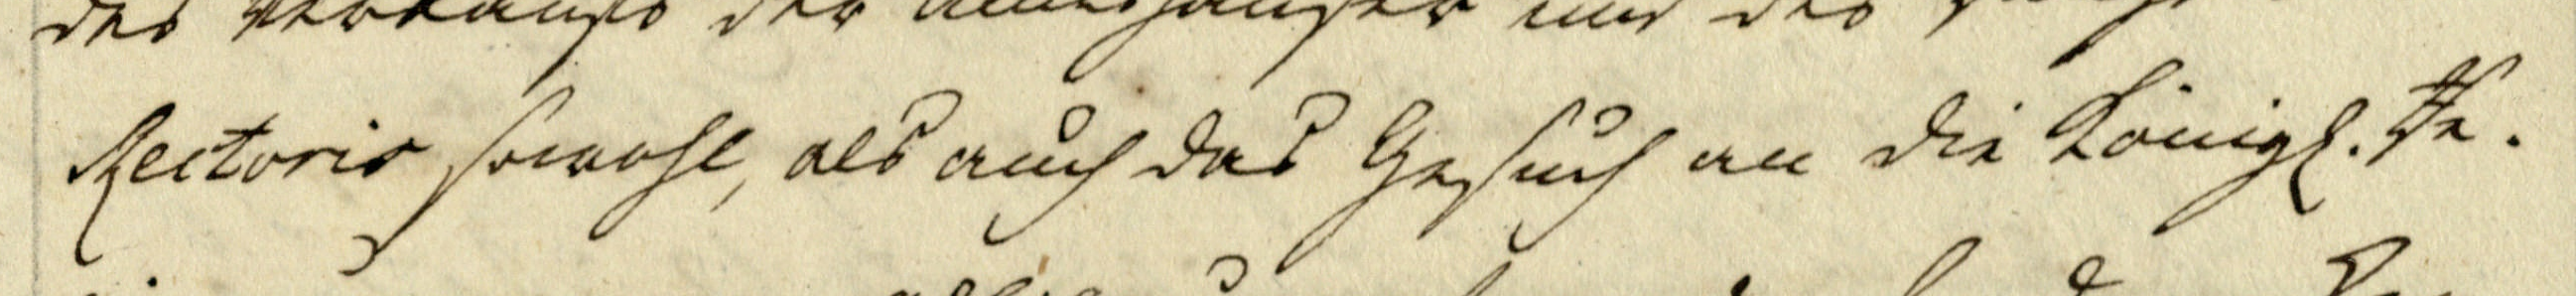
Rectoris sowohl, als auch das Gesuch an die Königl. Re¬
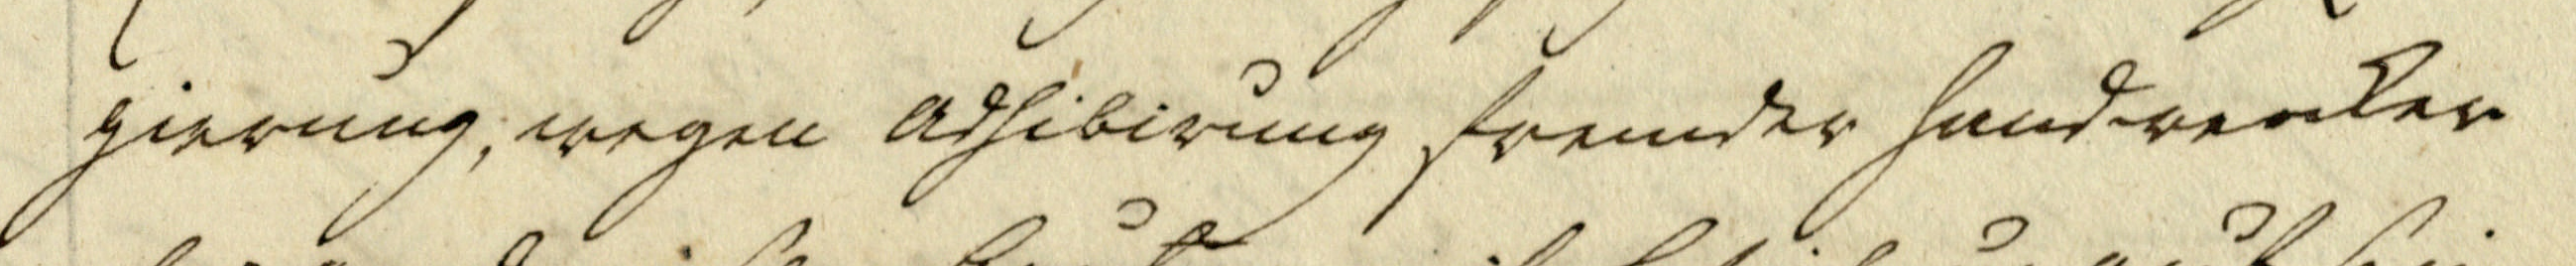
gierung, wegen Adhibirung fremder Handwercker
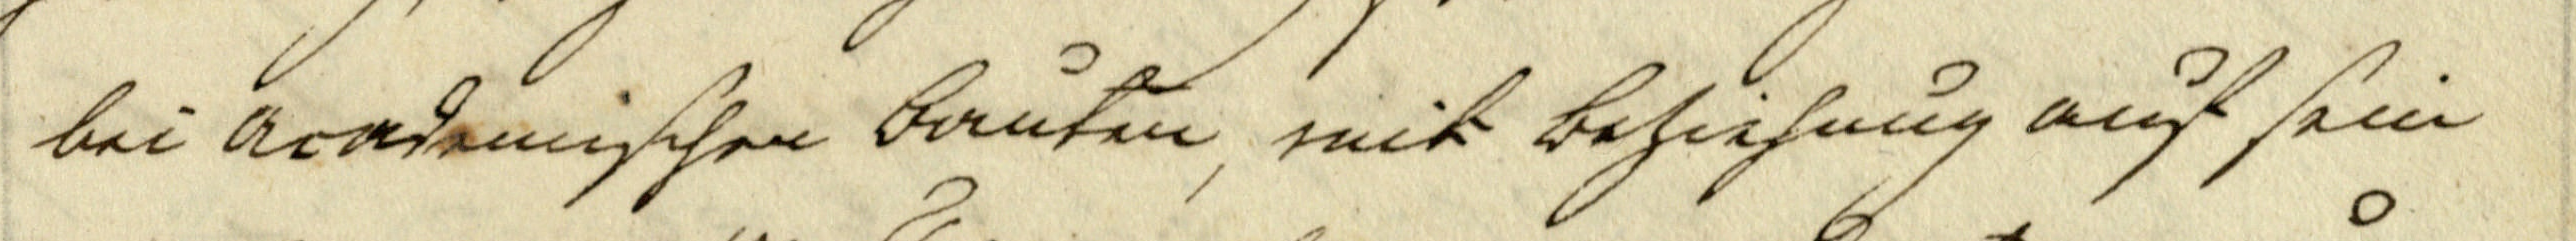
bei academischen Bauten, mit Beziehung auf sein
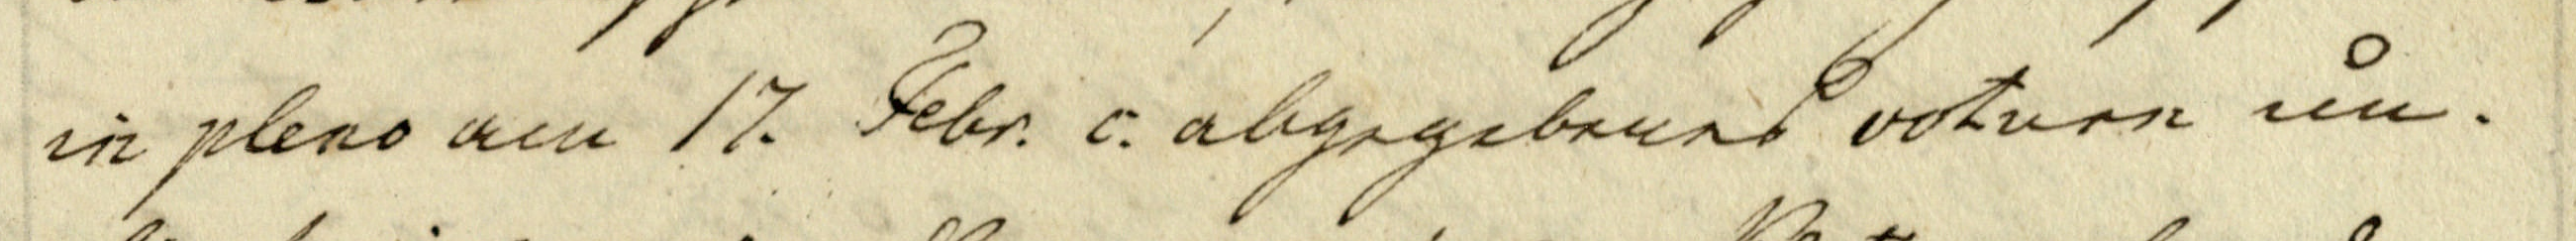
in pleno am 17. Febr. c. abgegebenes votum un¬
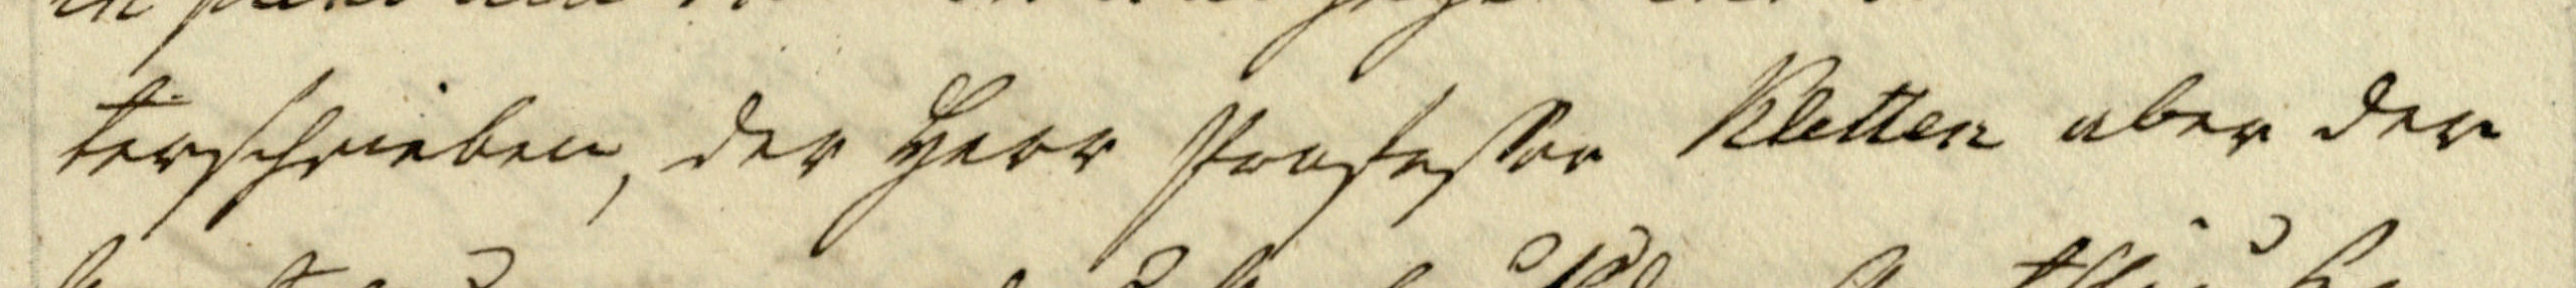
terschrieben, der Herr Professor Kletten aber der
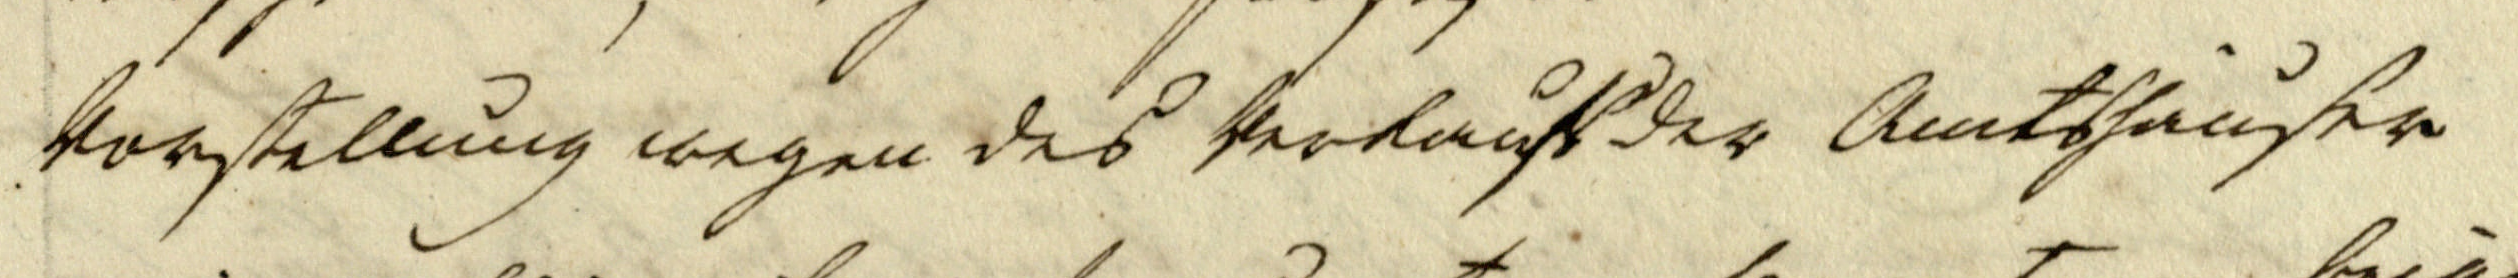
Vorstellung wegen des Verkaufs der Amtshäuser
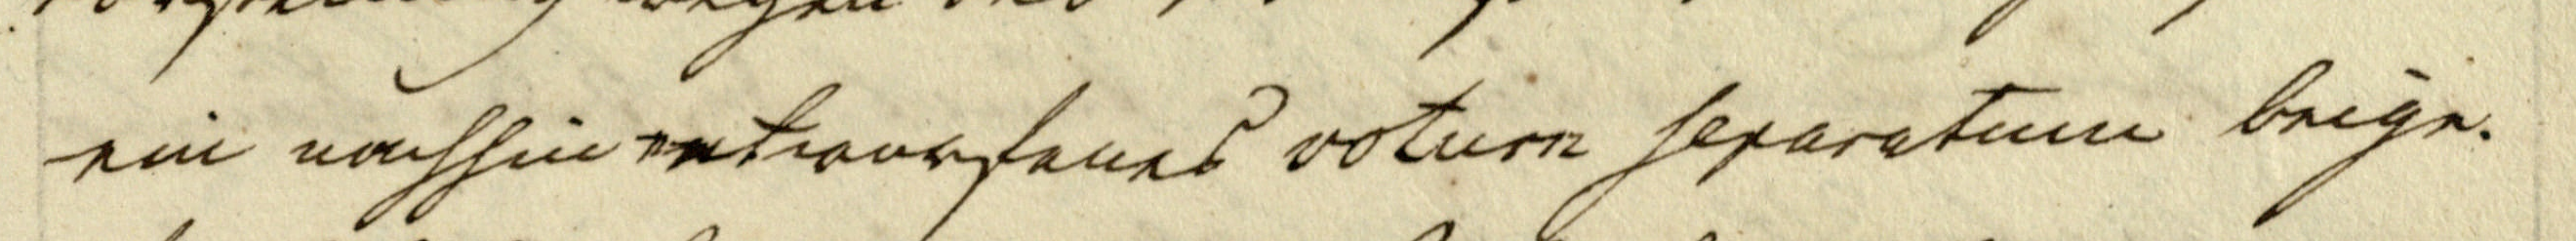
ein nachhin entworfenes votum separatum beige¬
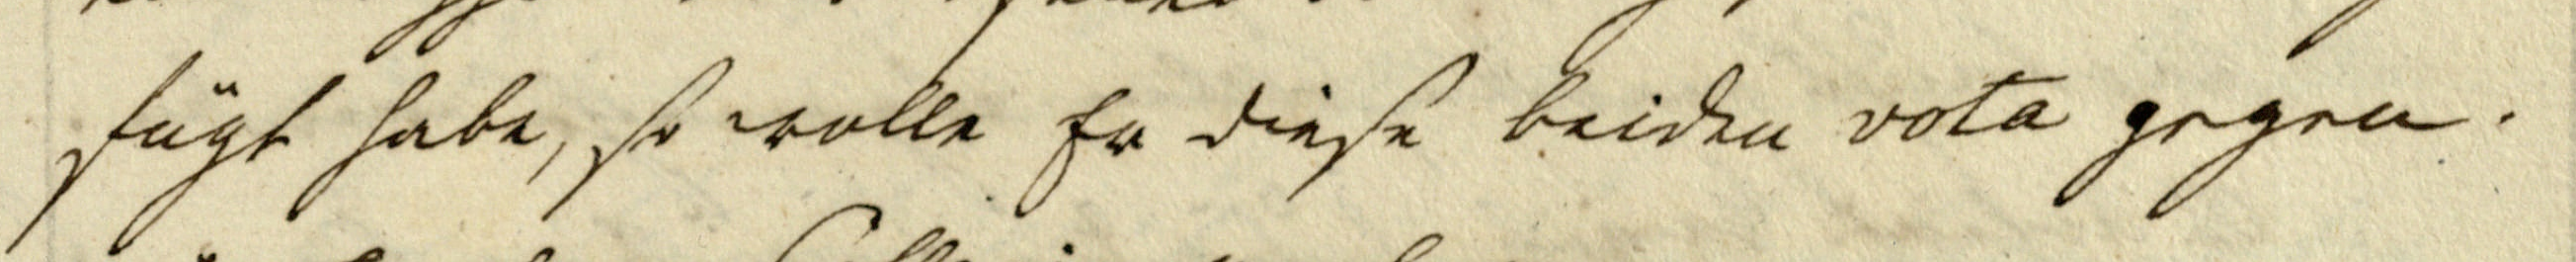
fügt habe, so wolle Er diese beiden vota gegen¬
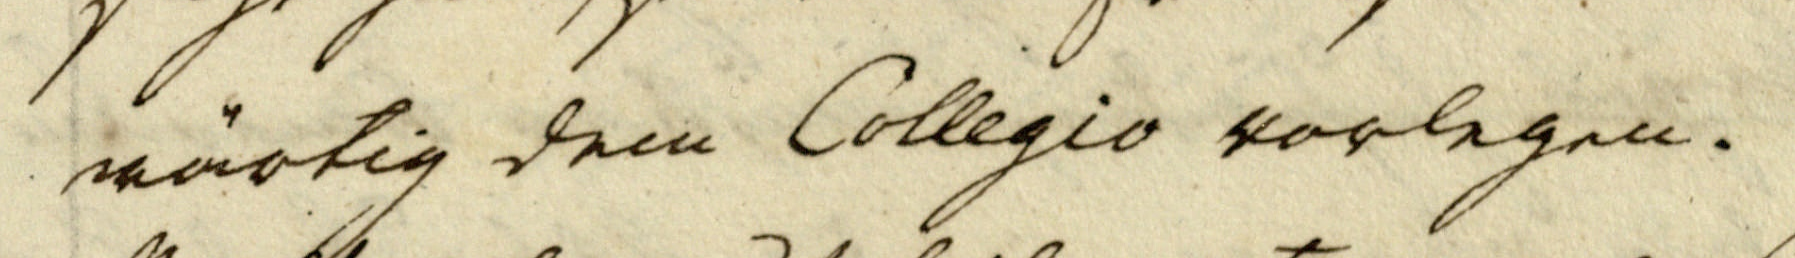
wärtig dem Collegio vorlegen.
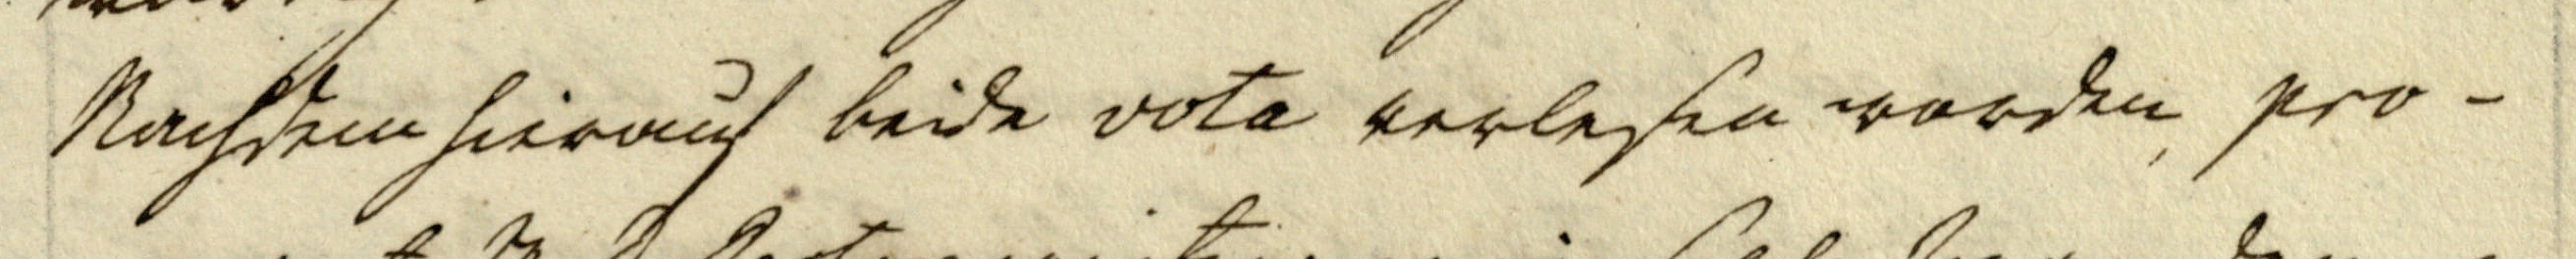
Nachdem hierauf beide vota verlesen worden, pro¬
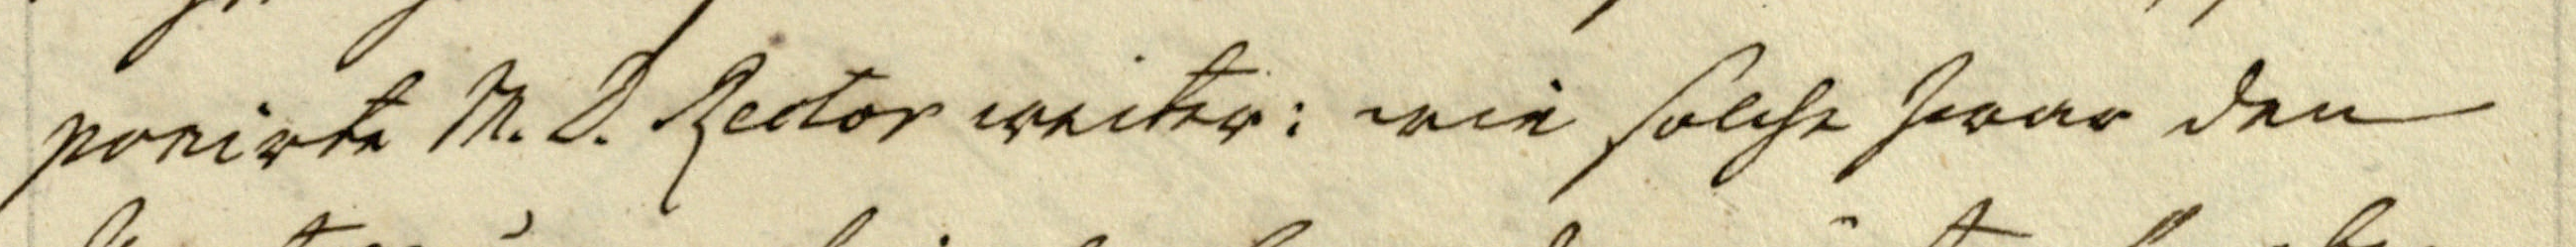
ponirte M. D. Rector weiter: wie solche zwar den
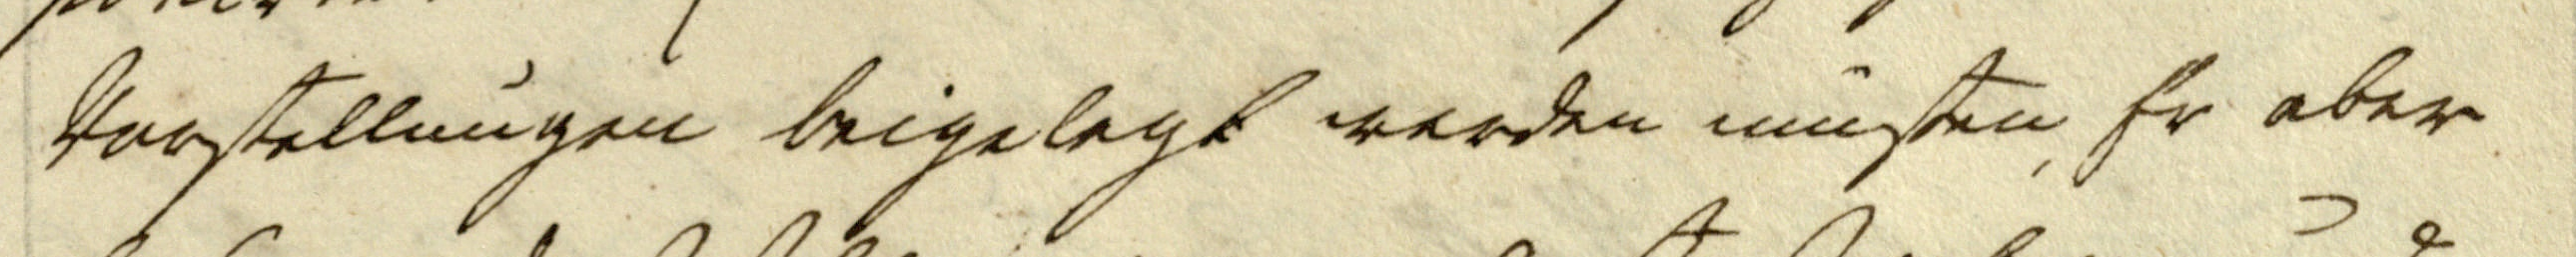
Vorstellungen beigelegt werden müßten, Er aber
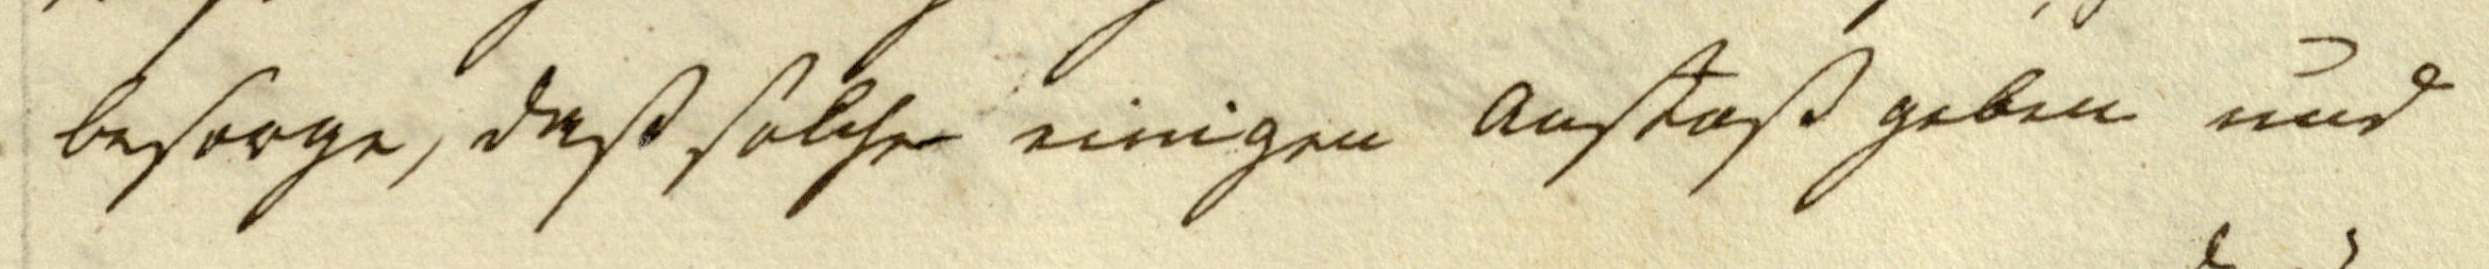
besorge, daß solche einigen Anstoß geben und
